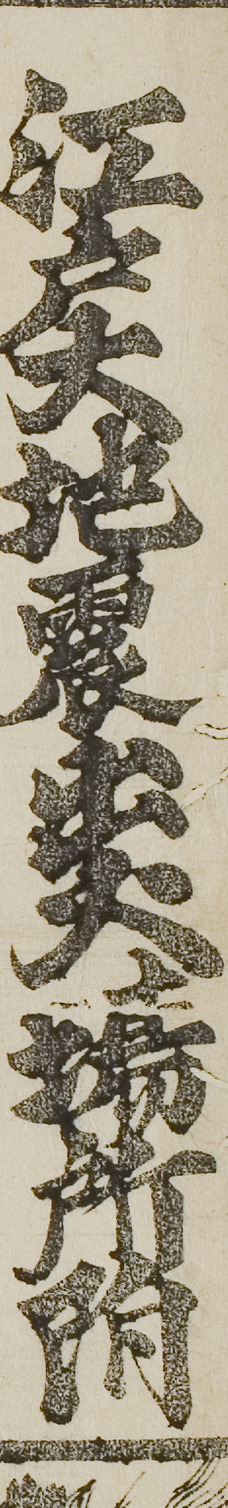江戸大地震出火場所附
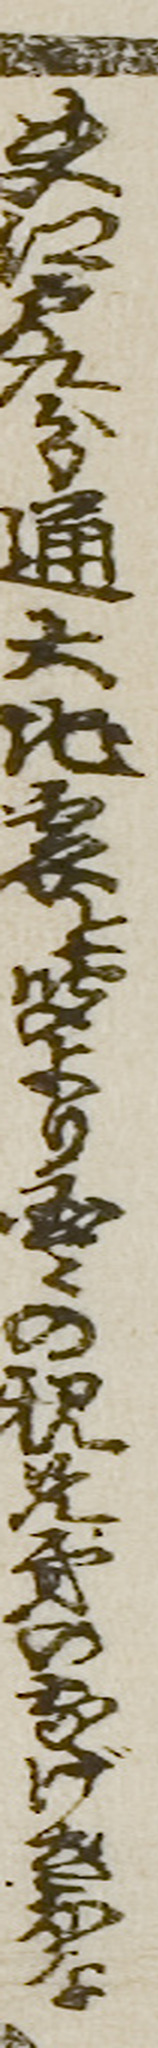夫江戸九分通大地震と聞より国々の親兄弟のなげきかな
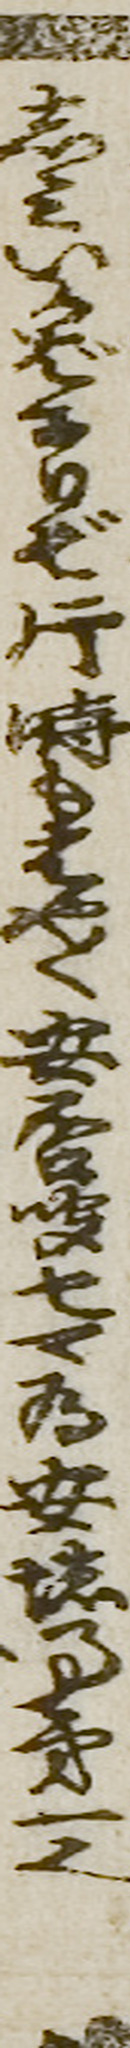しみいかばかりぞ片時もはやく安否聞セ可為安堵事第一也
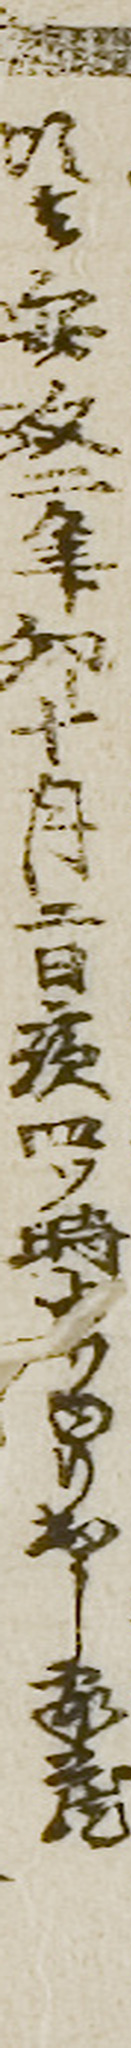頃は安政二年卯十月二日夜四ツ時よりゆり出し家蔵
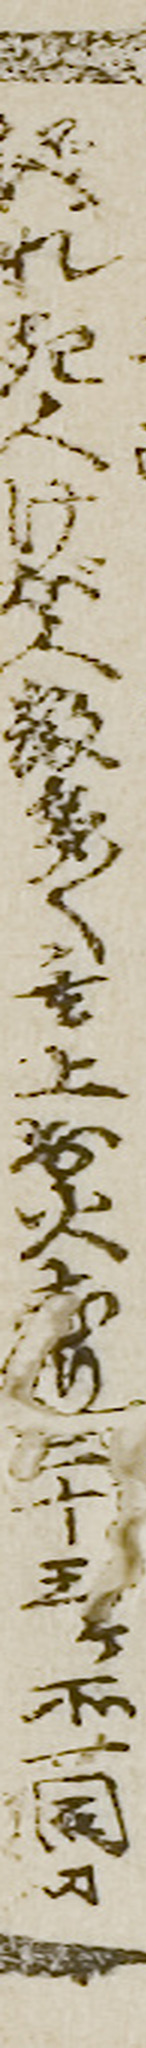潰れ死人けが人数多〳〵其上出火なり二十五ケ所一同に
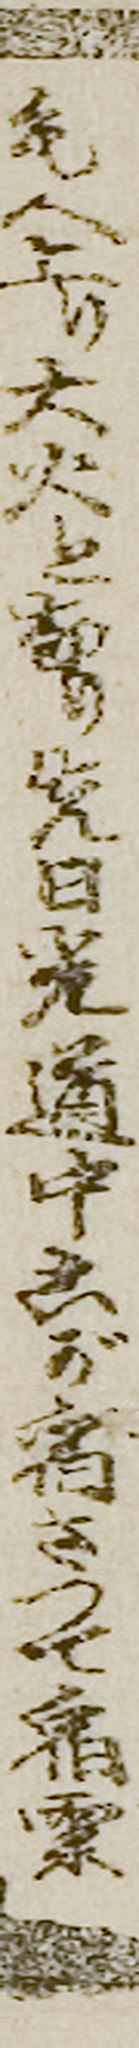もへ上り大火となり先日光道中こが宿さつて宿栗
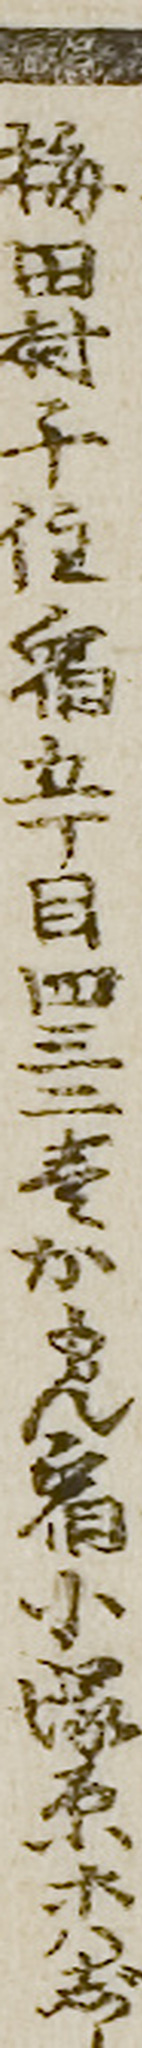梅田村千住宿五丁目四三二壱かもん宿小塚原等はじしん
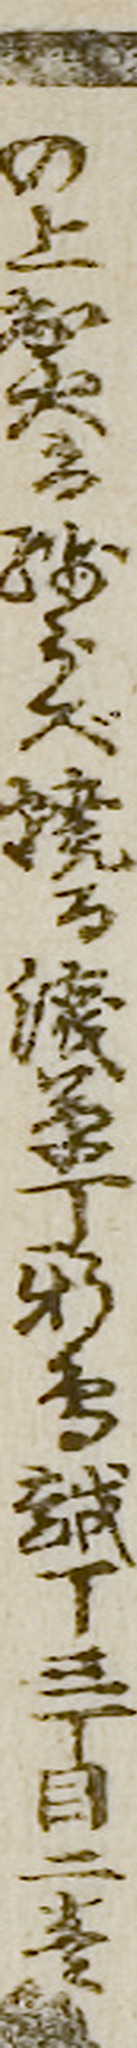の上出火にて残らず焼る浅草丁新鳥越丁三丁目二壱
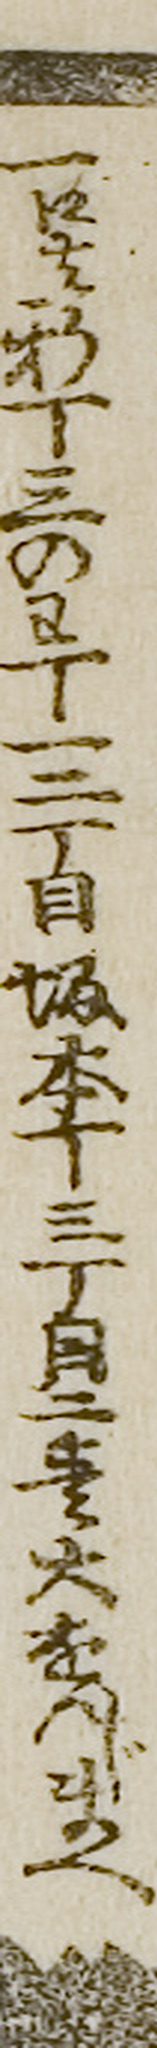一口は新丁三のわ丁一二丁坂本丁三丁目二重大をんじまへ
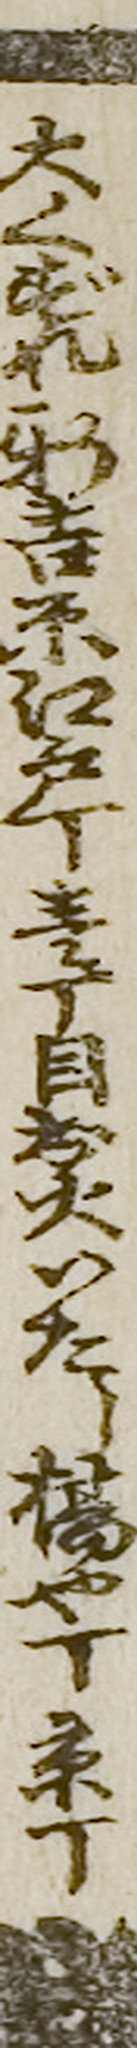大くづれ新吉原江戸丁壱丁目出火いたし橋や丁京丁
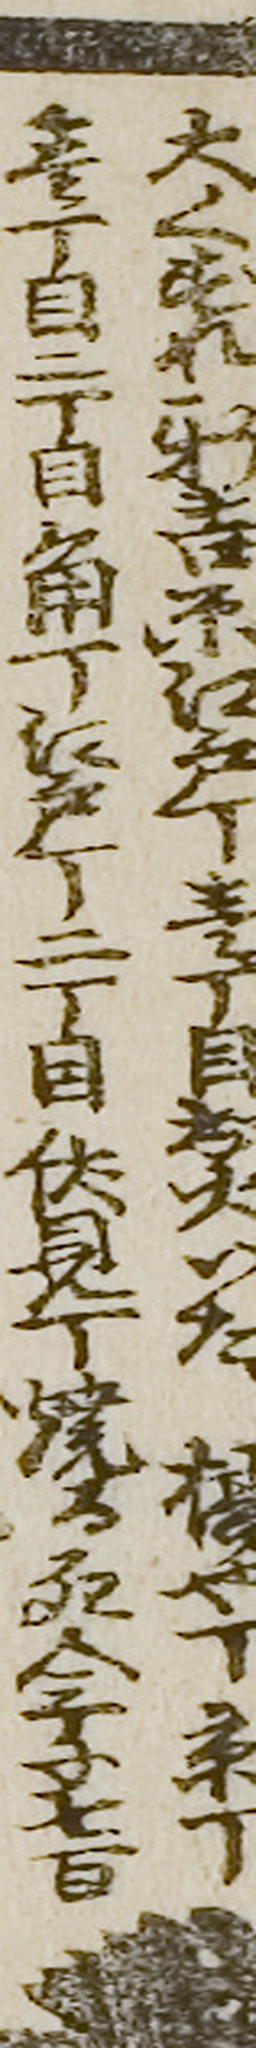壱丁目二丁目角丁江戸丁二丁目伏見町焼る死人三千七百
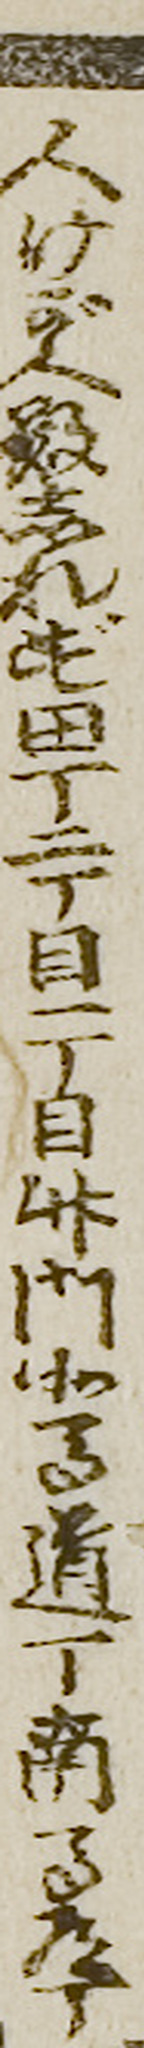人けが人数しれず田丁二丁目一丁目竹門北馬道丁南馬道丁
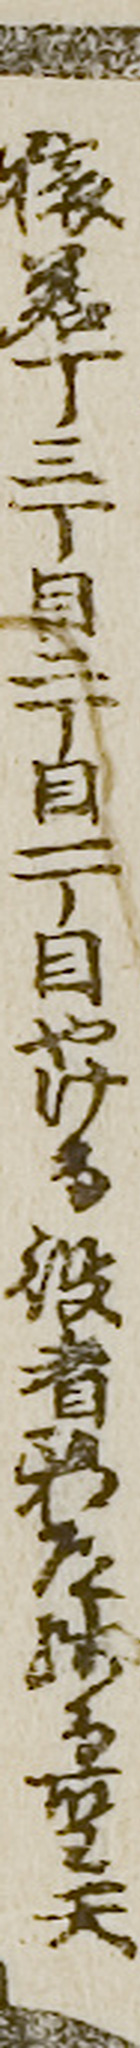猿若丁三丁目二丁目一丁目やける役者新道残る聖天
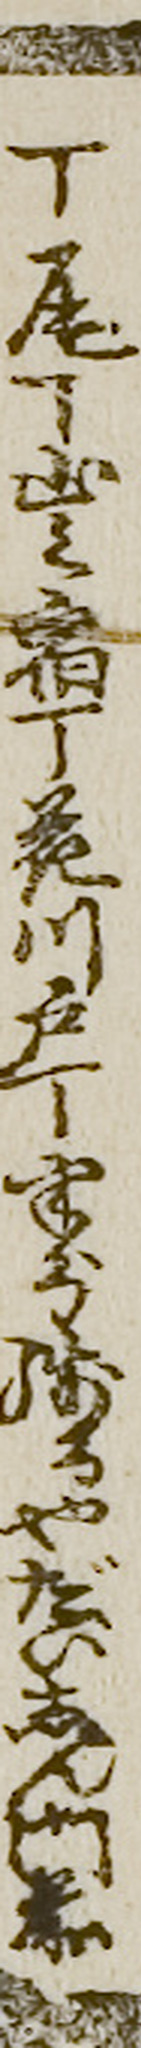丁瓦丁山之宿丁花川戸丁半分残る也だいしん門前
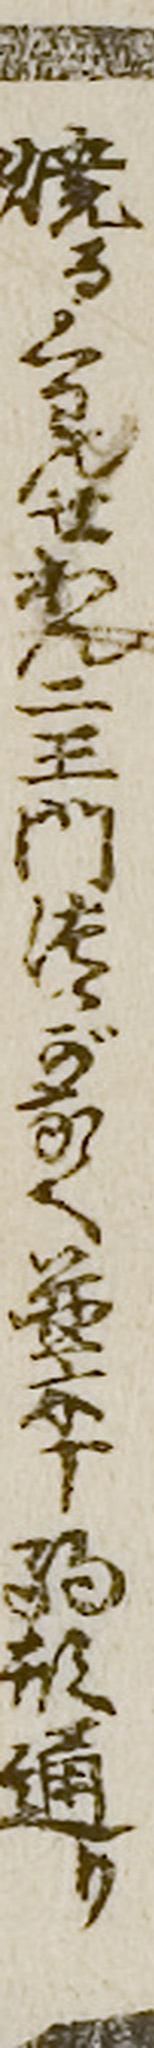焼るくわんせおん二王門つゝがなく並木丁駒形通り
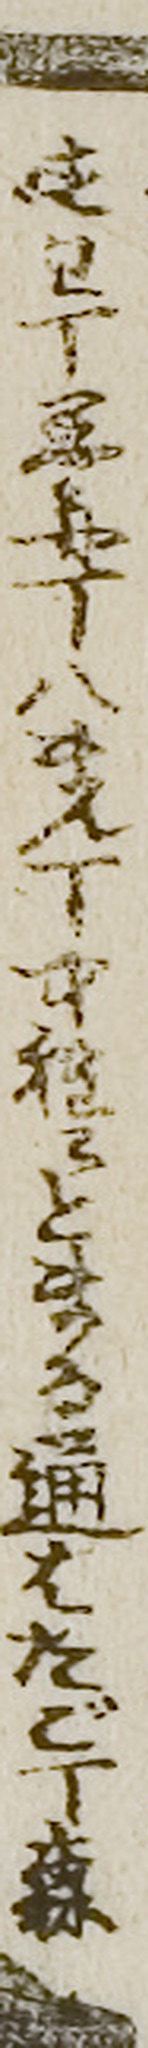すわ丁黒舟丁八まん丁中程にてとまる通はたご丁森
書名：江戸大地震出火場所附
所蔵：東京大学総合図書館 General Library in the University of Tokyo, JAPAN
